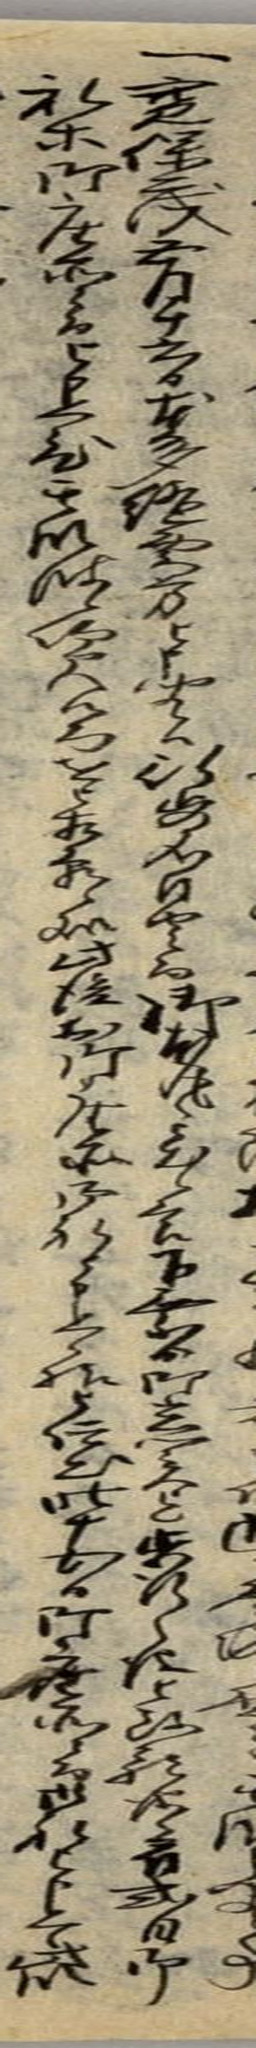礼等御座所に而被申上度其段波々伯部八左衛門を被相願候処此後於御座所御礼被申上候様被仰出昨十五日御座所に而御祝被申上此段
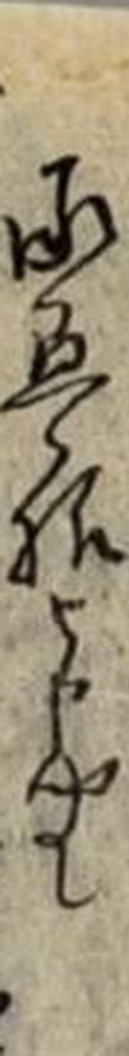承置候様被申聞候
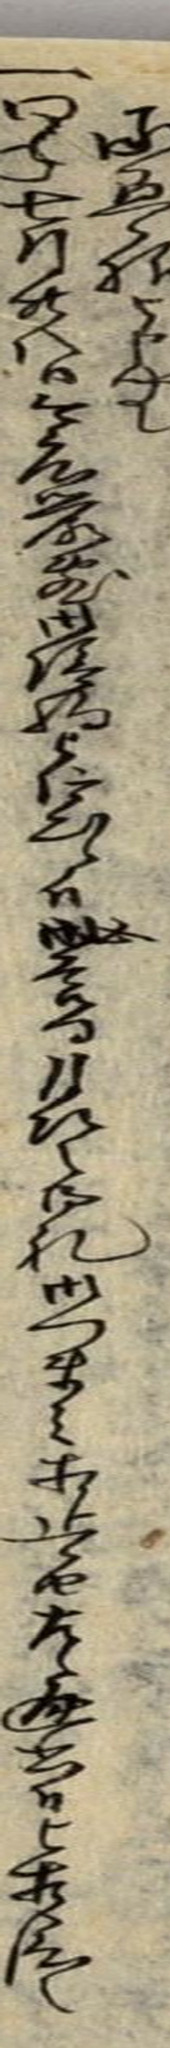一同年七月廿八日今度厳敷御倹約被仰出候に付五節句月次之御礼御つまみ相止候由左之通書付被相渡候
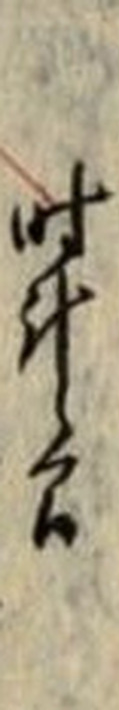時計之間
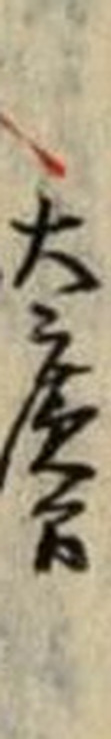大広間
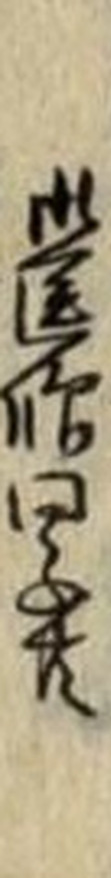御医師同子共
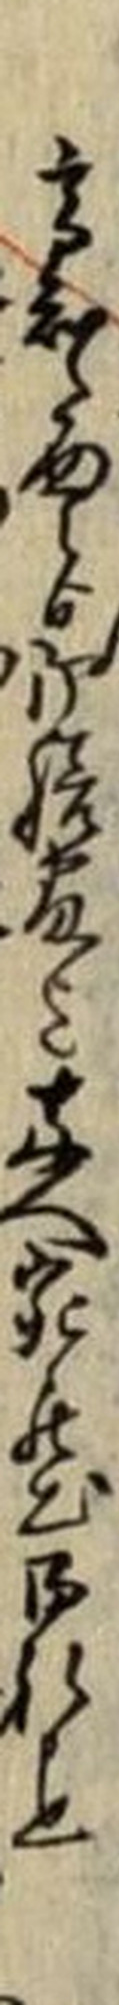高知之面々ゟ御膳番迄両人宛罷出御礼申上
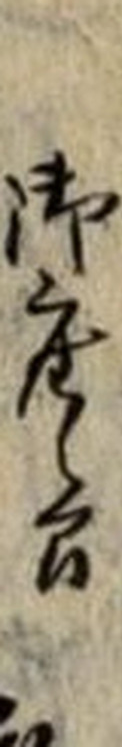御座之間
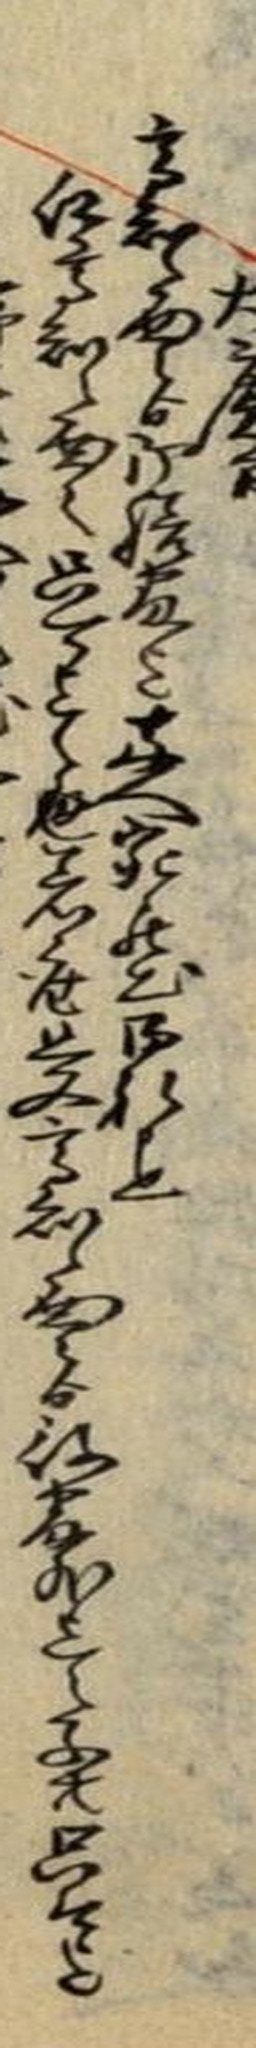但高知之面々只今迄之通着座且又高知之面々ゟ役番外迄之子共只今迄
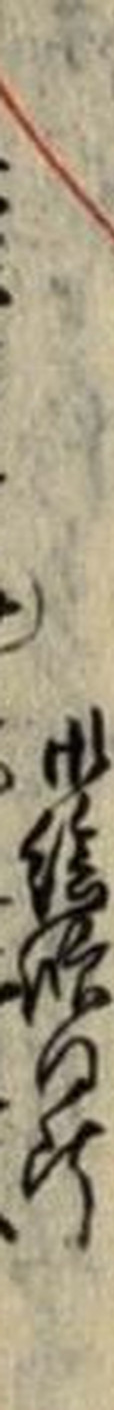御絵師同断
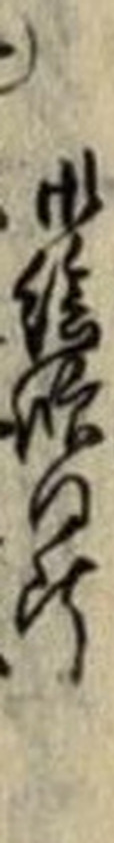御絵師同断
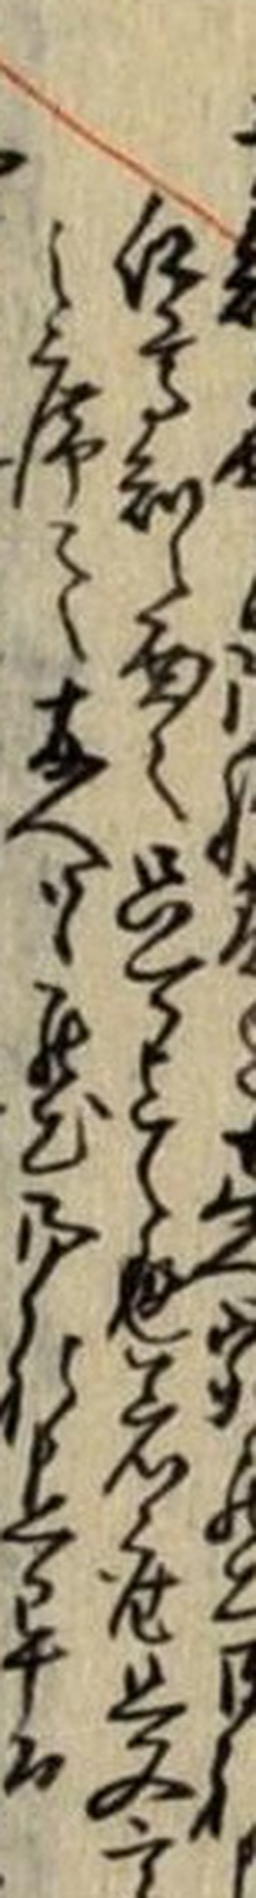之席々へ両人つゝ罷出御礼申上畢而
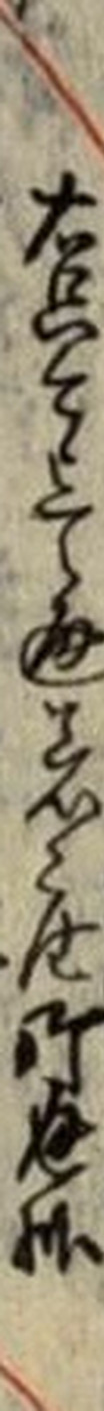右只今迄之通着座御通掛
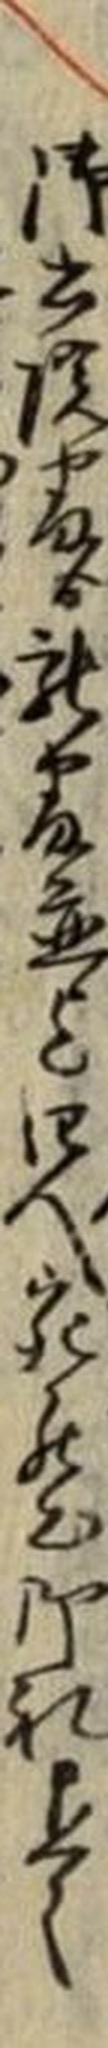御書院番ゟ新番並迄四人宛罷出御礼申上之
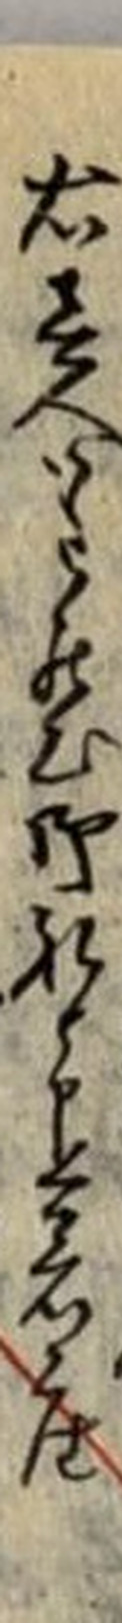右壱人つゝ被罷出御祝被申上着座
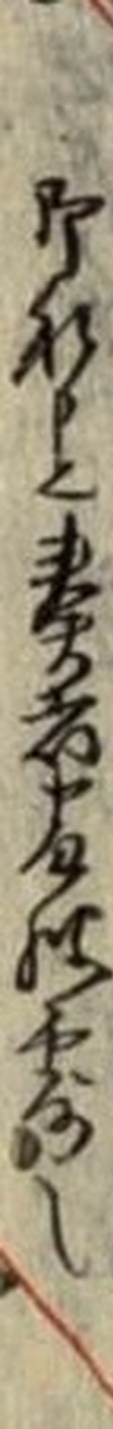御礼申上奏者番披露之
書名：蒐輯之部
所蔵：福井県文書館 Fukui Prefectural Archives
